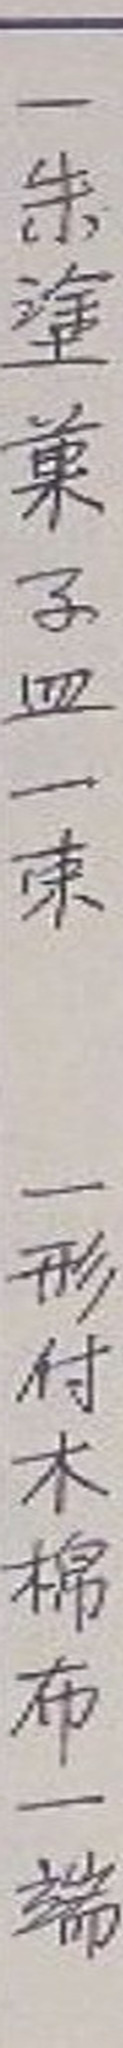一朱塗菓子皿一束一形付木棉布一端
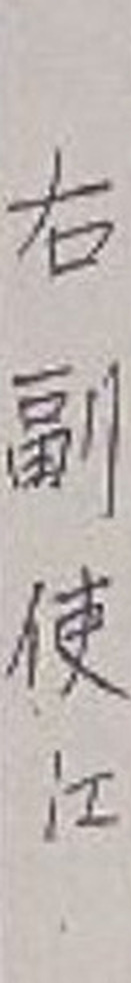右副使え

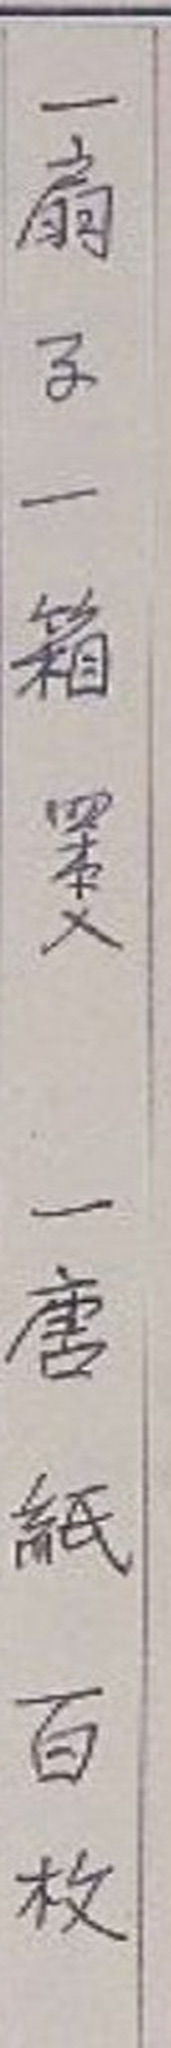一扇子一箱四本入一唐紙百枚
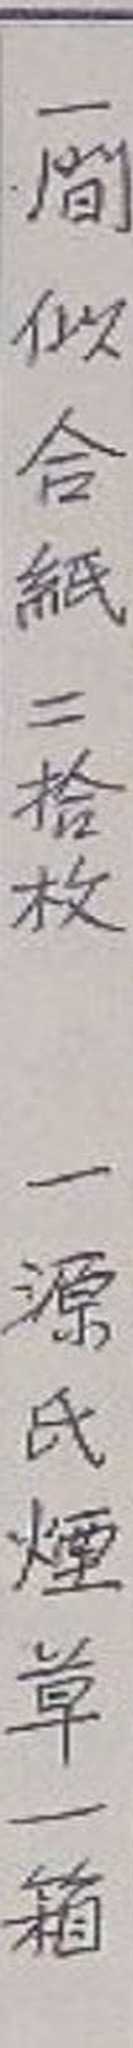一間似合紙二拾枚一源氏煙草一箱
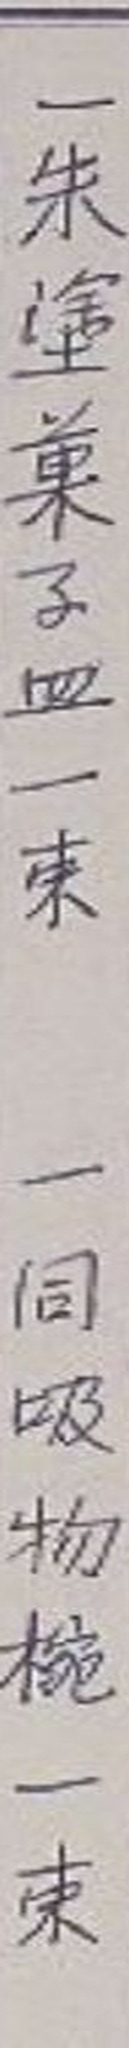一朱塗菓子皿一束一同吸物椀一束
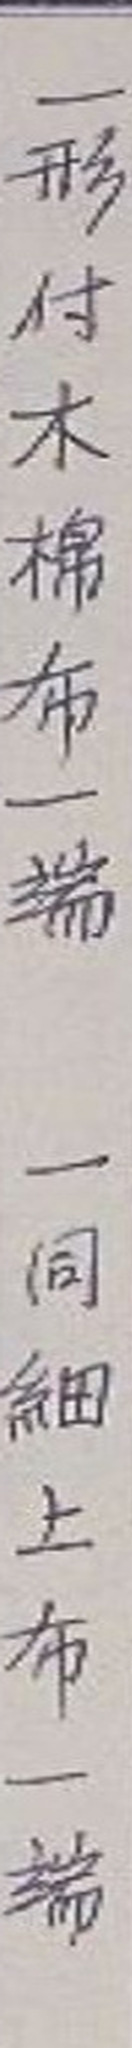一形付木棉布一端一同細上布一端
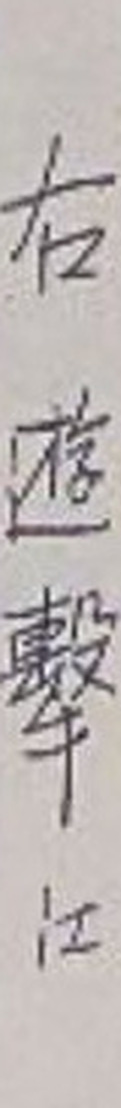右遊撃え
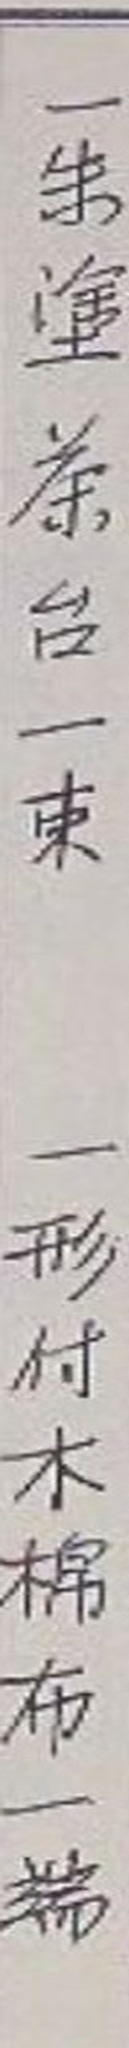一朱塗茶台一束一形付木棉布一端
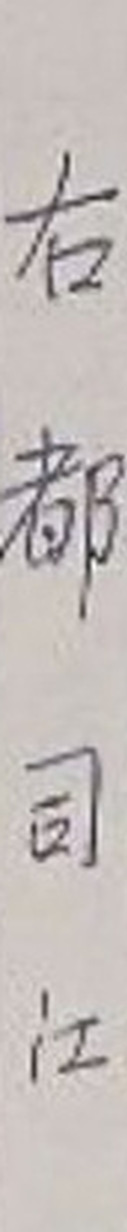右都司え
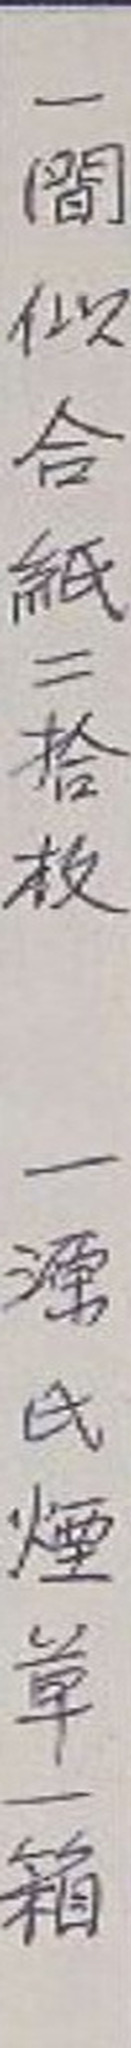一間似合紙二拾枚一源氏煙草一箱
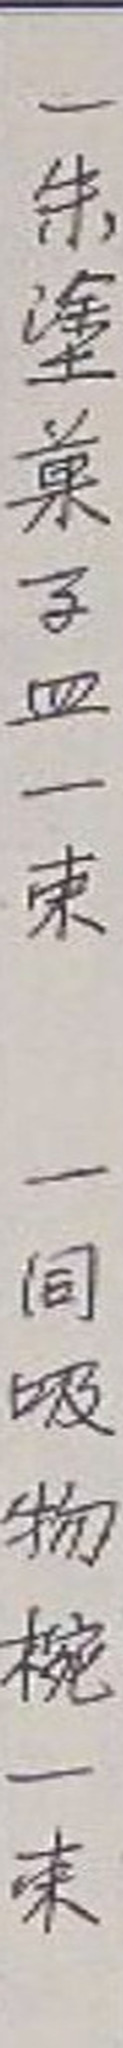一朱塗菓子皿一束一同吸物椀一束
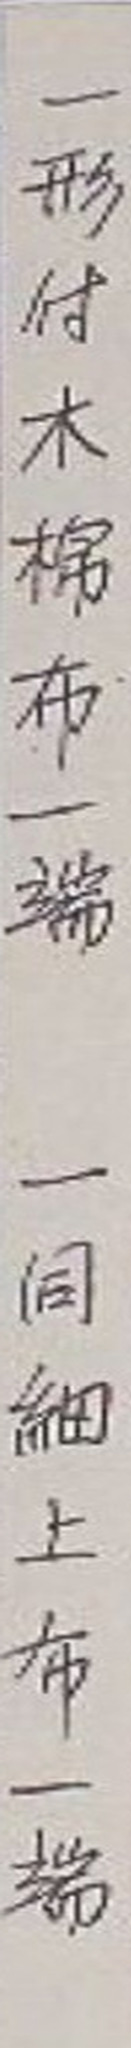一形付木棉布一端一同細上布一端
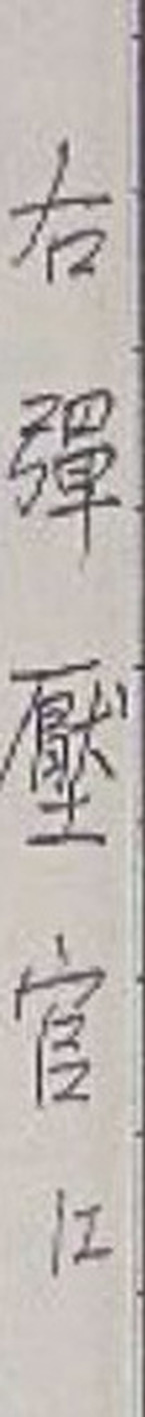右弾圧官え
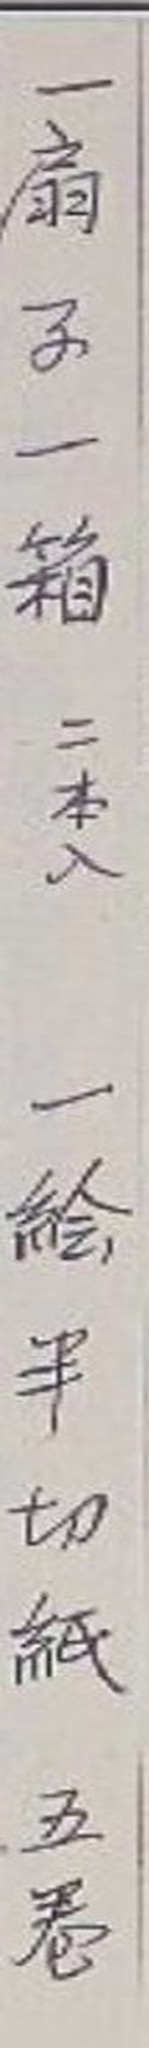一扇子一箱二本入一絵半切紙五巻
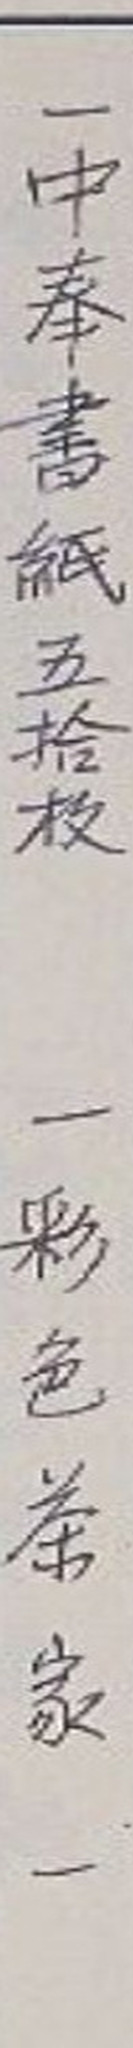一中奉書紙五拾枚一彩色茶家一
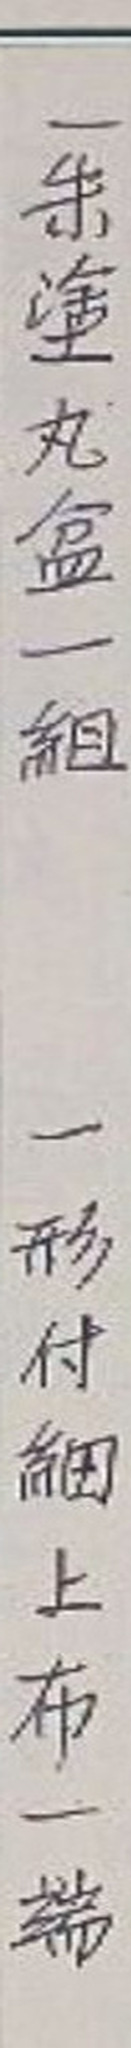一朱塗丸盆一組一形付細上布一端
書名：支那冊封使来琉諸記 下巻
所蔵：University of the Ryukyus Library
